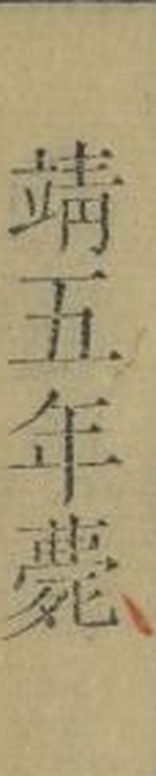靖五年薨

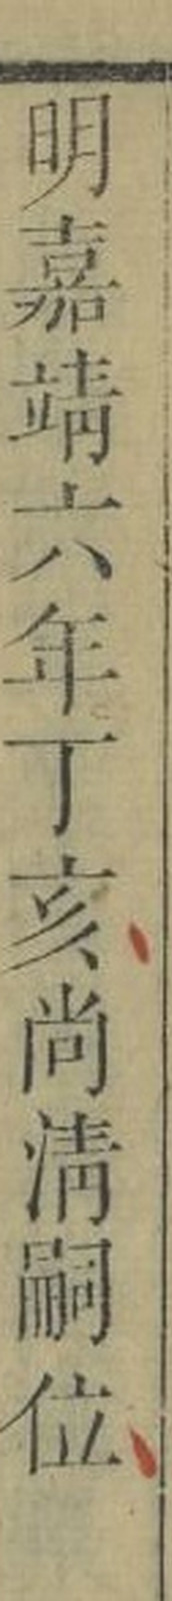明嘉靖六年丁亥尚清嗣位
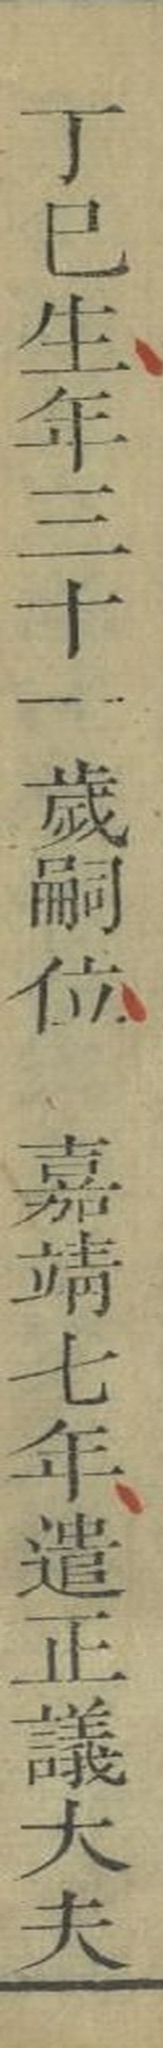丁巳生年三十一歳嗣位嘉靖七年遣正議大夫
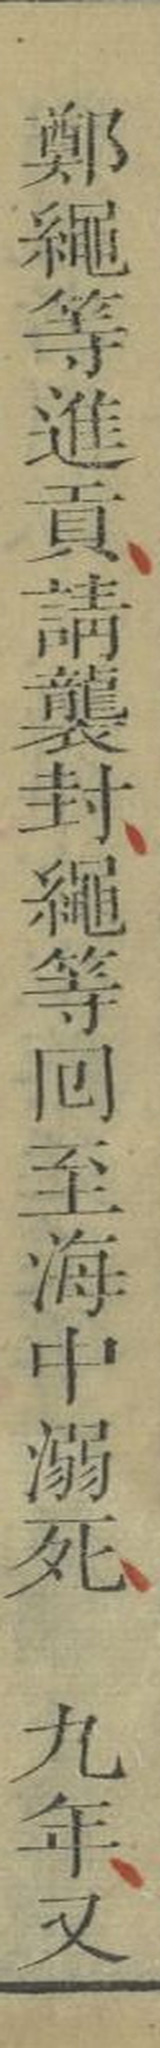鄭縄等進貢請襲封縄等回至海中溺死九年又
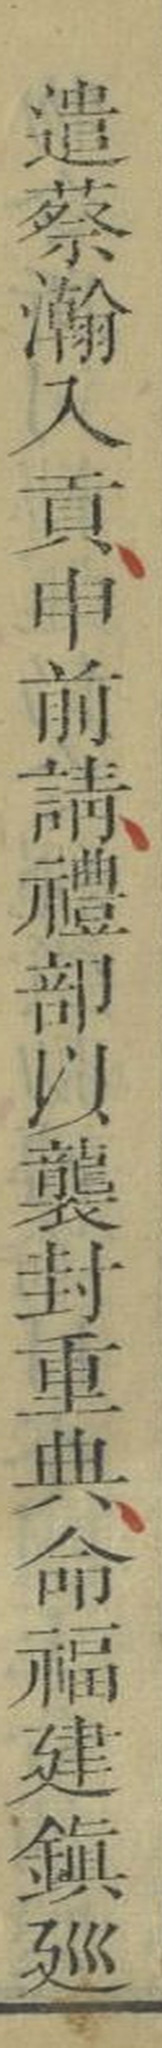遣蔡瀚入貢申前請礼部以襲封重典命福建鎮巡
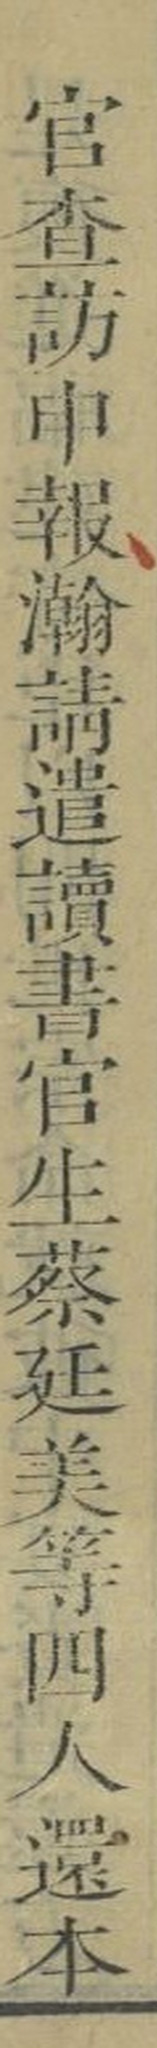官査訪申報瀚請遣読書官生蔡廷美等四人還本
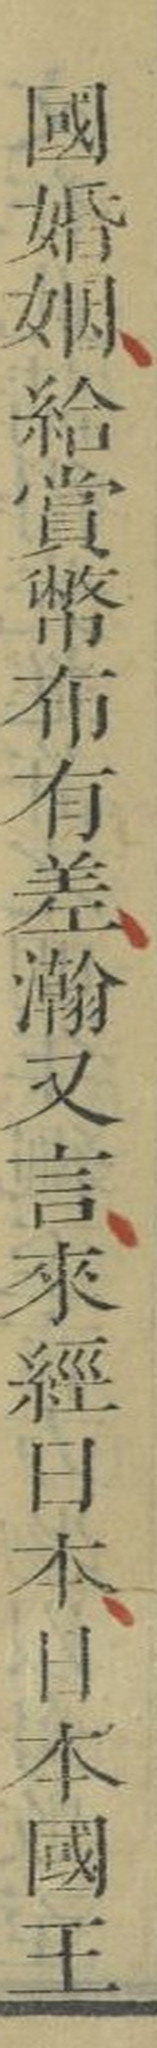国婚姻給賞幣布有差瀚又言来経日本日本国王
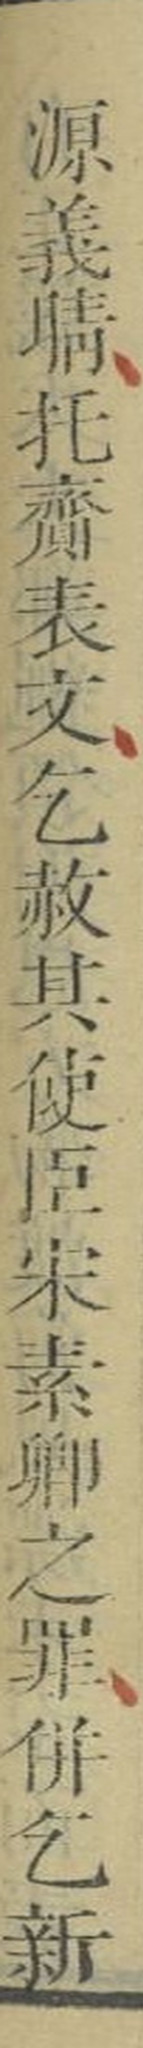源義晴托齎表文乞赦其使臣宋素卿之罪併乞新
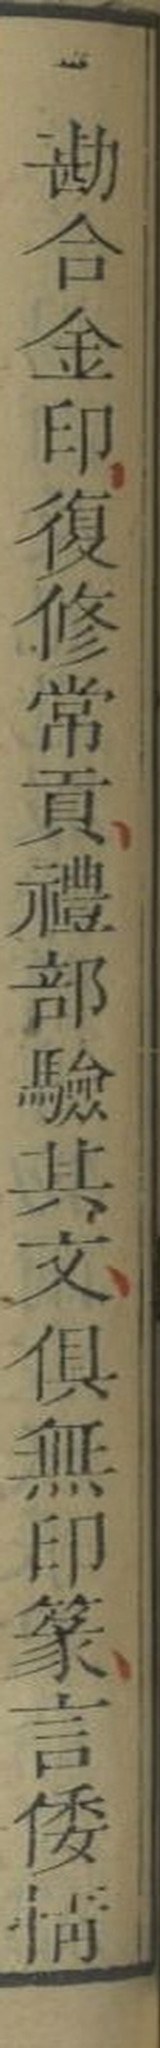勘合金印復修常貢礼部験其文俱無印篆言倭情
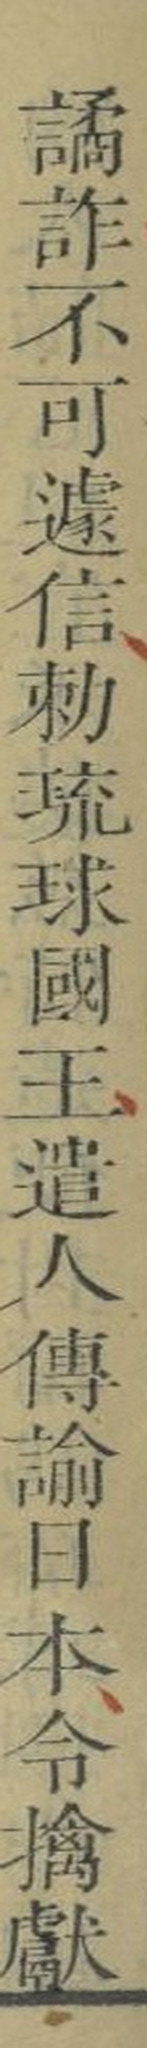譎詐不可遽信勅琉球国王遣人伝諭日本令擒献
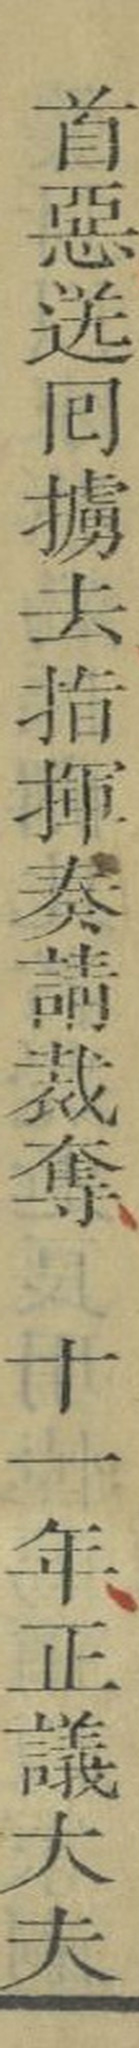首悪送回擄去指揮奏請裁奪十一年正議大夫
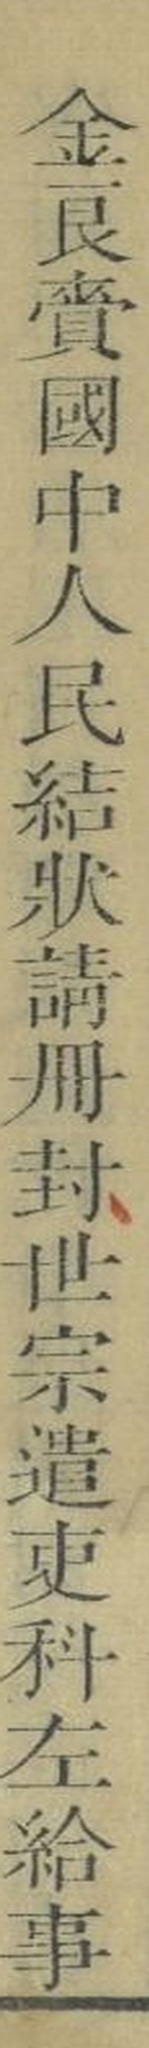金良賚国中人民結状請冊封世宗遣吏科左給事
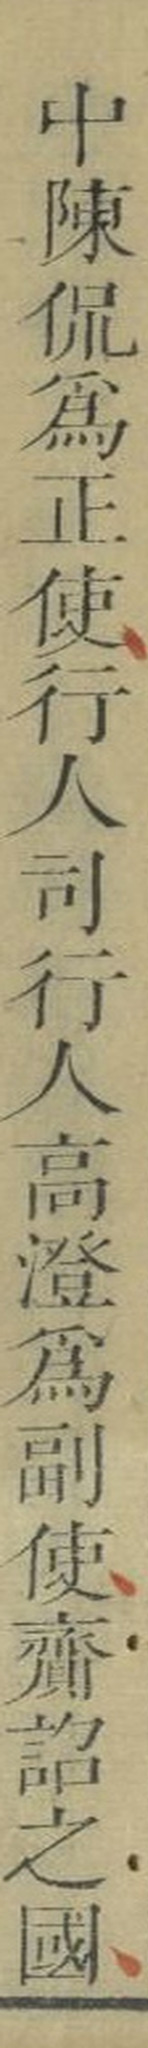中陳侃為正使行人司行人高澄為副使齎詔之国
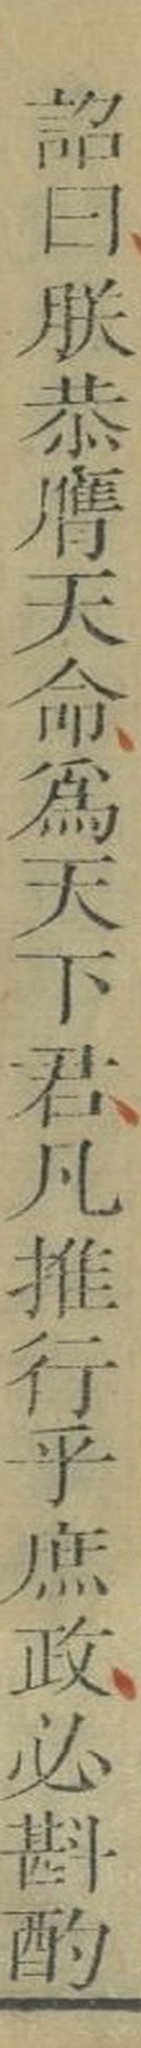詔曰朕恭膺天命為天下君凡推行乎庶政必斟酌
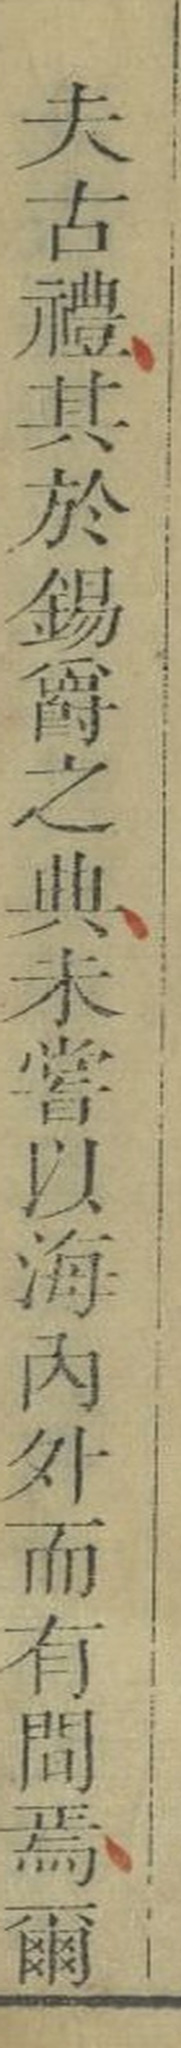夫古礼其於錫爵之典未嘗以海内外而有間焉爾
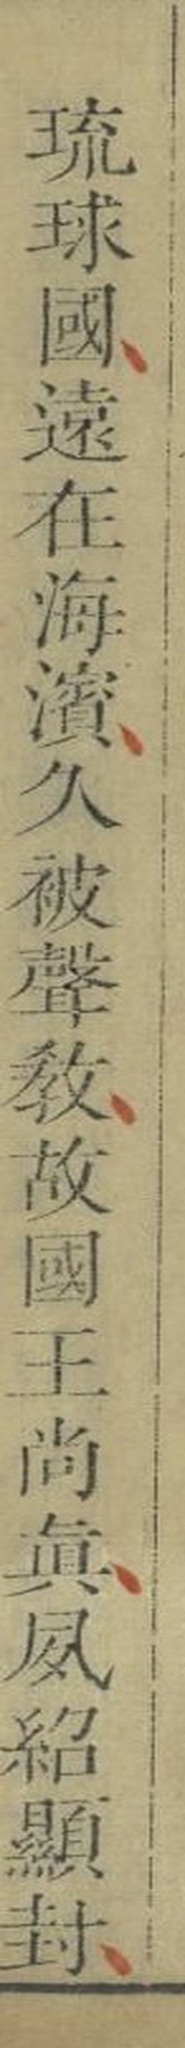琉球国遠在海浜久被声教故国王尚真夙紹顕封
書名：中山伝信録 巻三
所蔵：University of the Ryukyus Library
